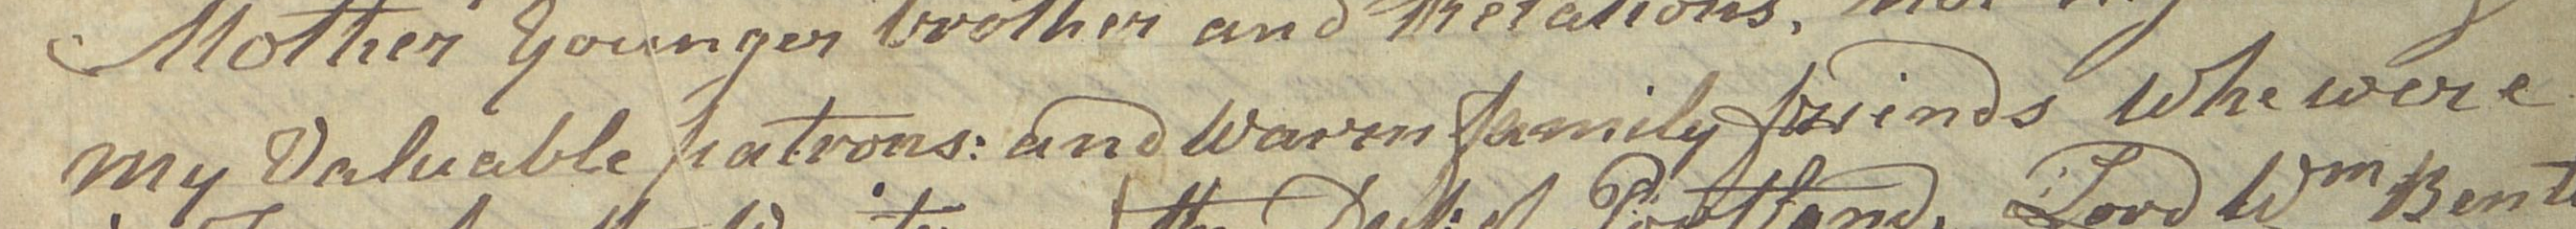My Valuable patrons: and warm family friends whe were
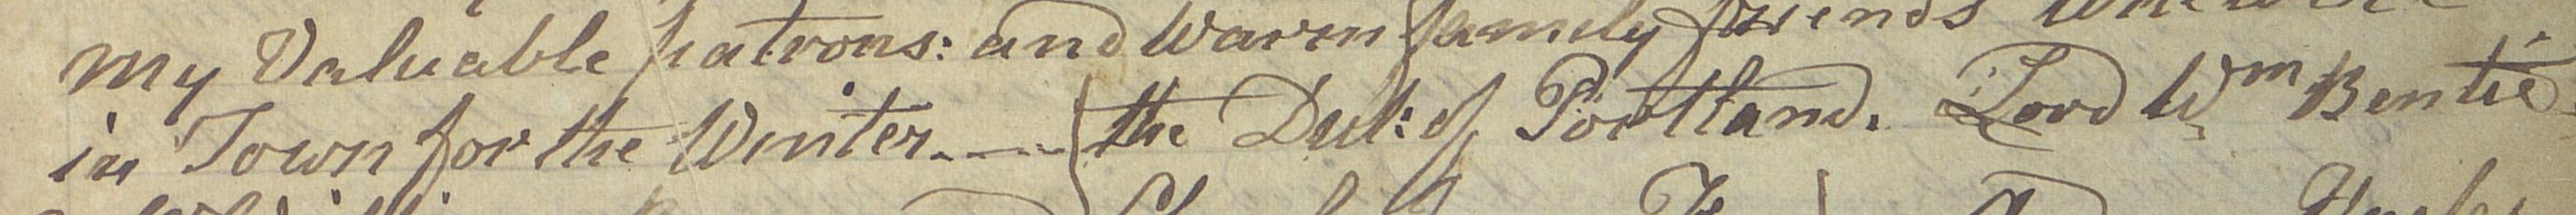in Town for the Winter. (The Dul: of Portland. Lord W^m. Bentie
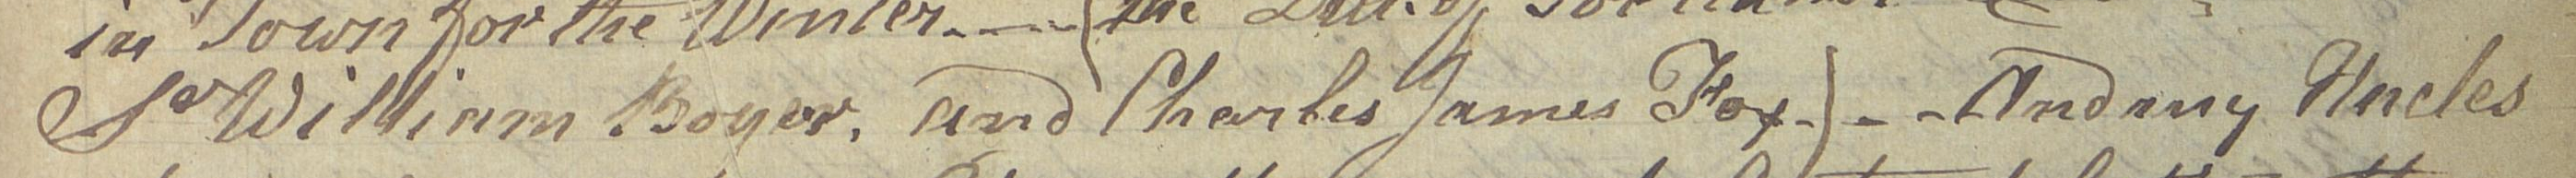S^r William Boyer, and Charles James Fox.) And my Uncles
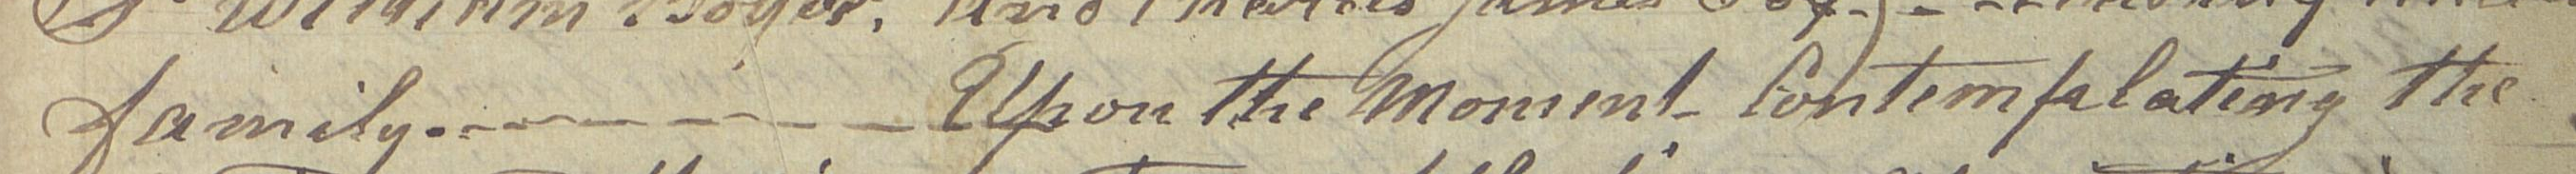family. Upon the Moment Contemplating the
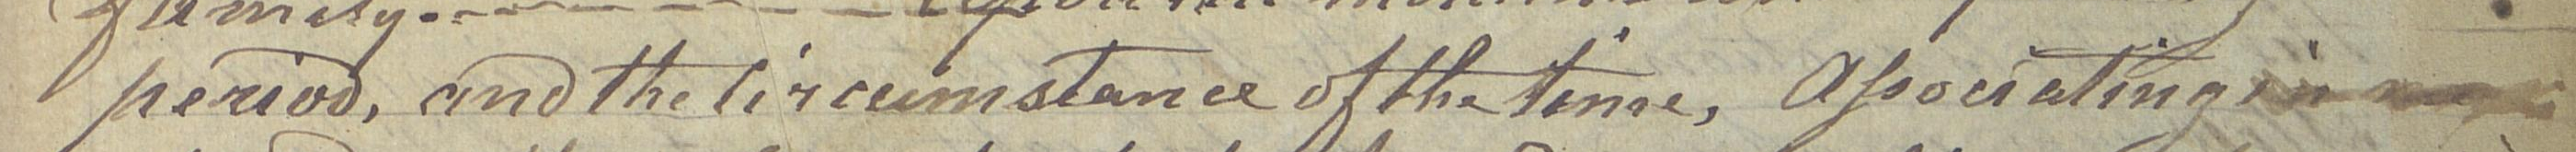period, and the Circumstance of the time, Associating in
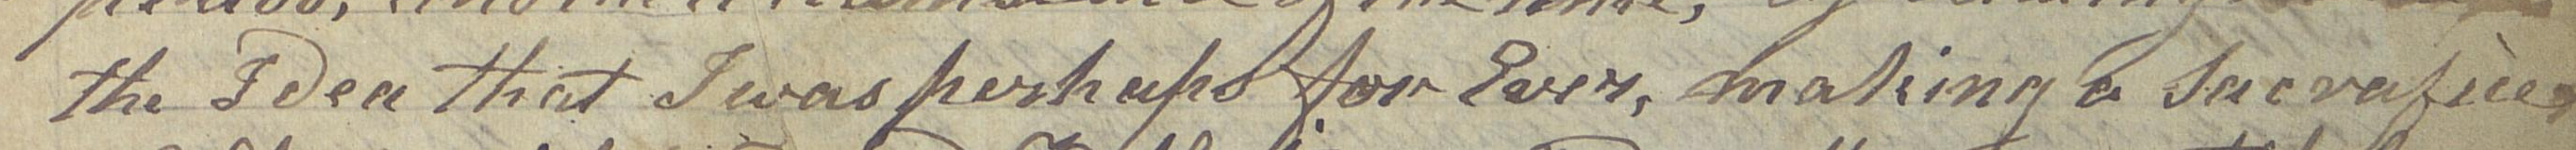the Idea that I was perhaps for Ever, making a sacrafice
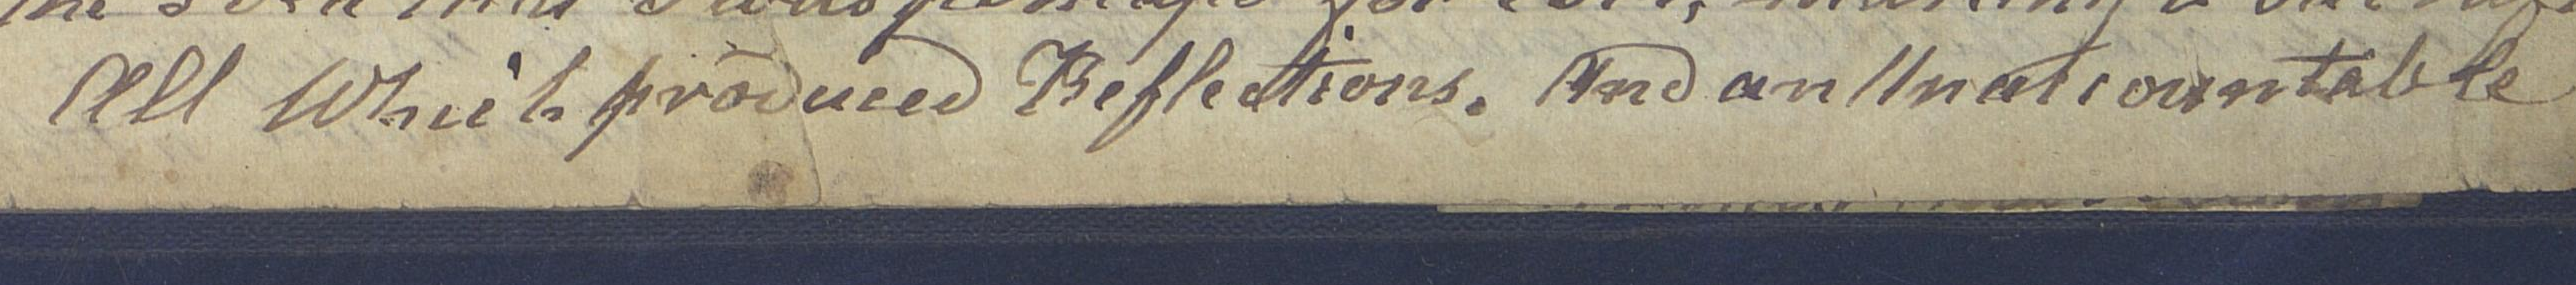All which produced Reflections. And an Unaccountable
